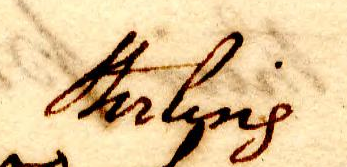sterling
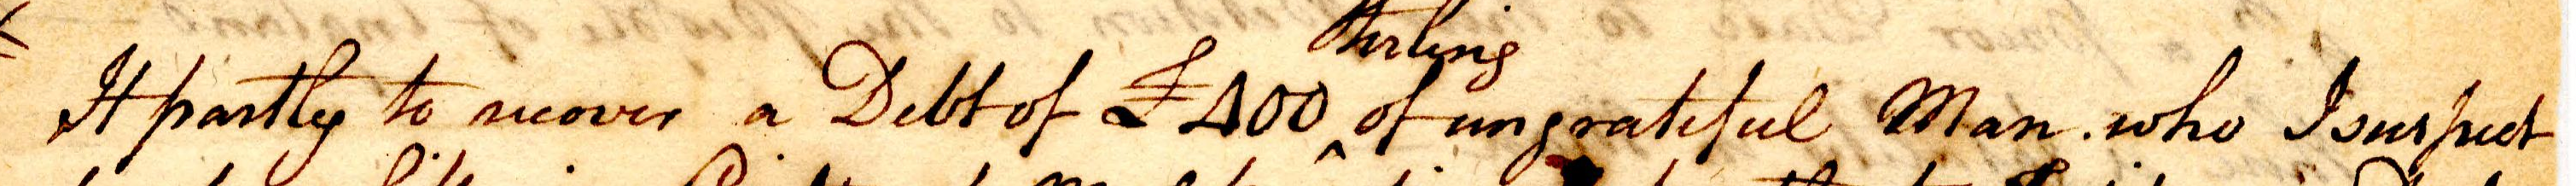It partly to recover a Debt of £400 ^ of ungrateful Man. who I suspect
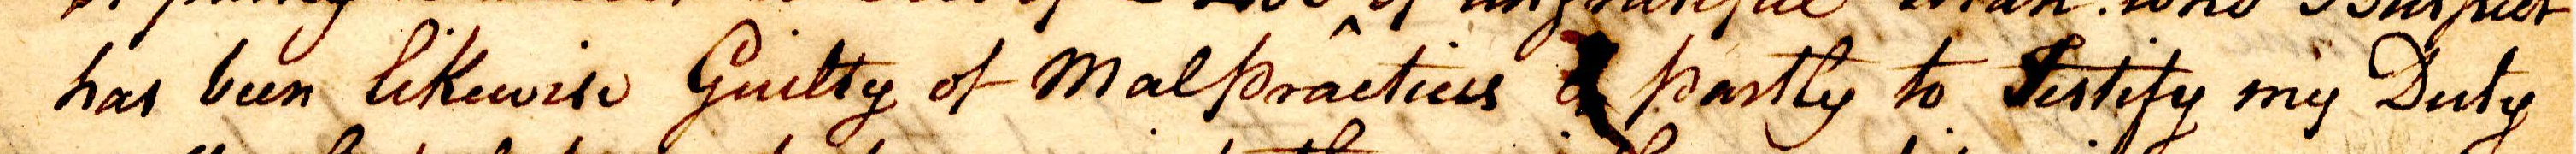has been likewise Guilty of Malpractices & partly to Testify my Duty
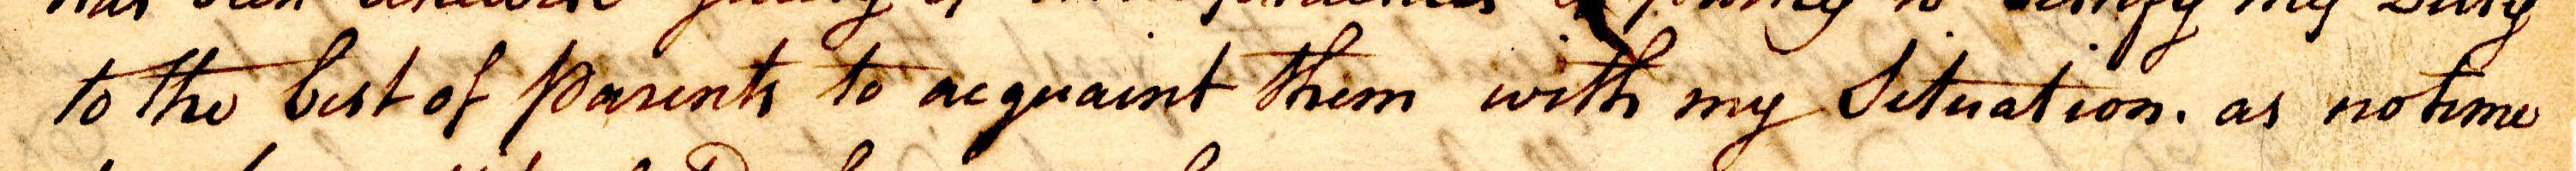to the best of parents to acquaint them with my Situation as no time
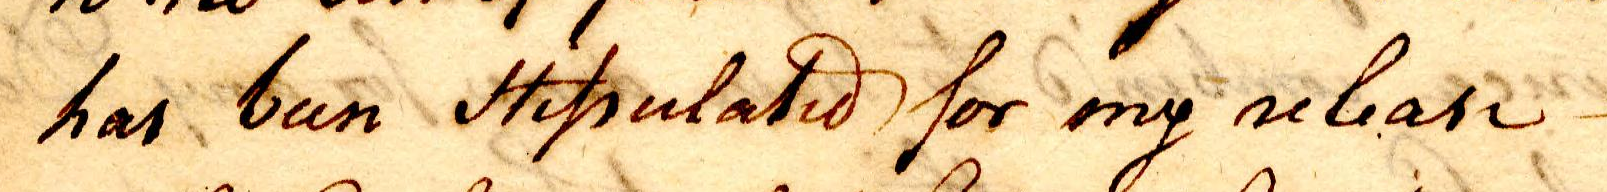has been stipulated for my release
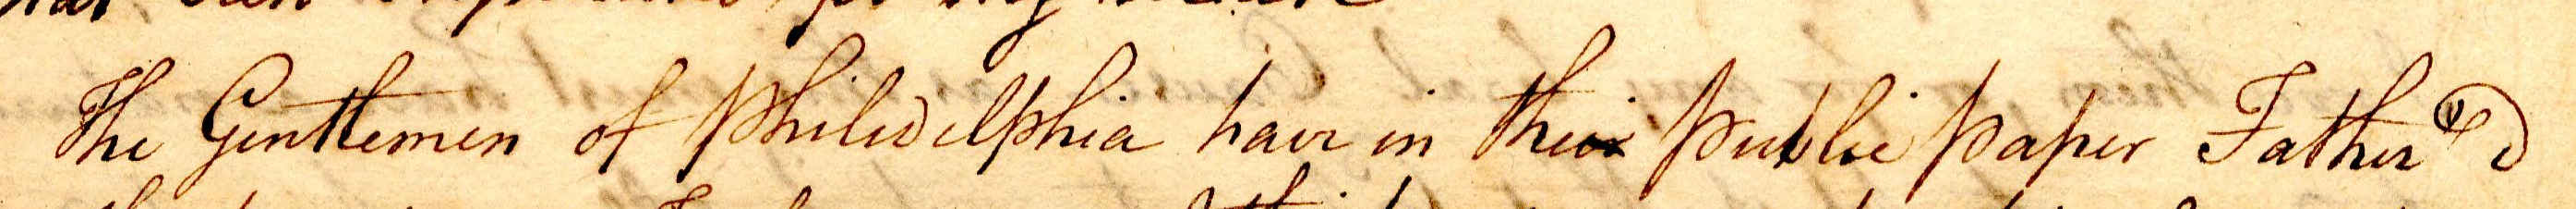The Gentlemen of Philadelphia have in their public paper Father'd
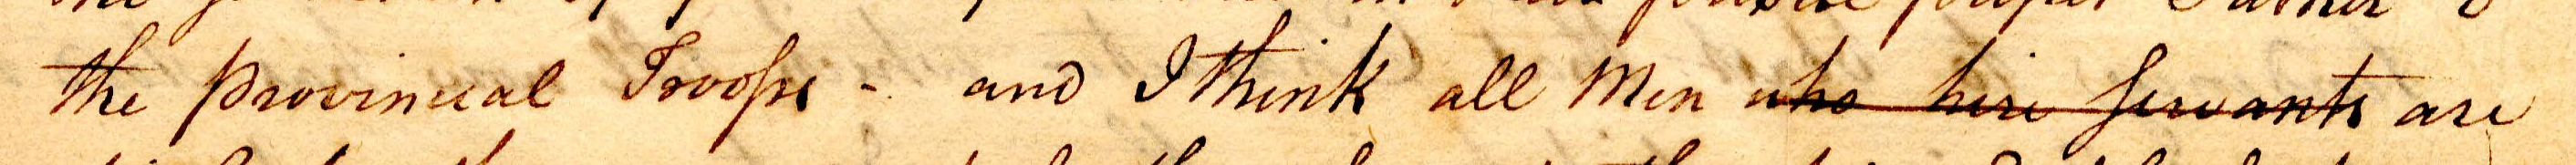the provincial Troops and I think all Men [who hire servants] are
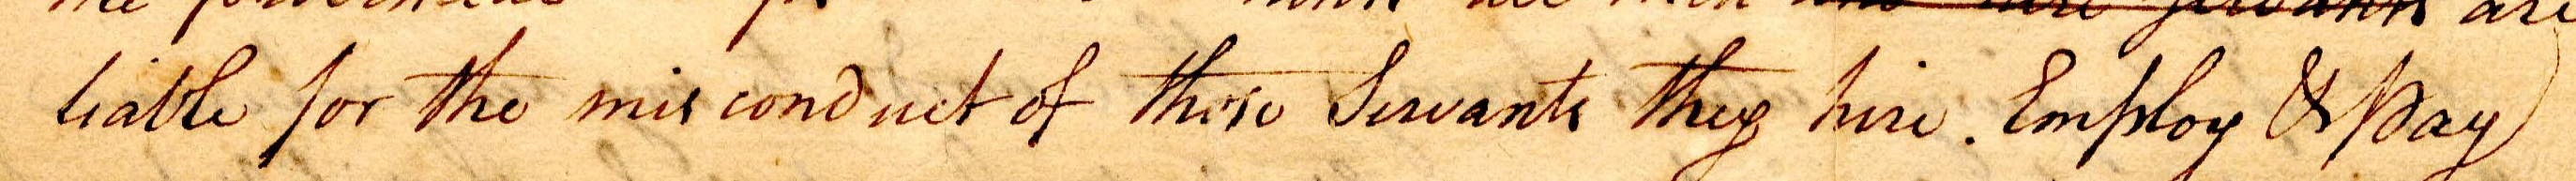liable for the misconduct of those servants they hire Employ & pay
